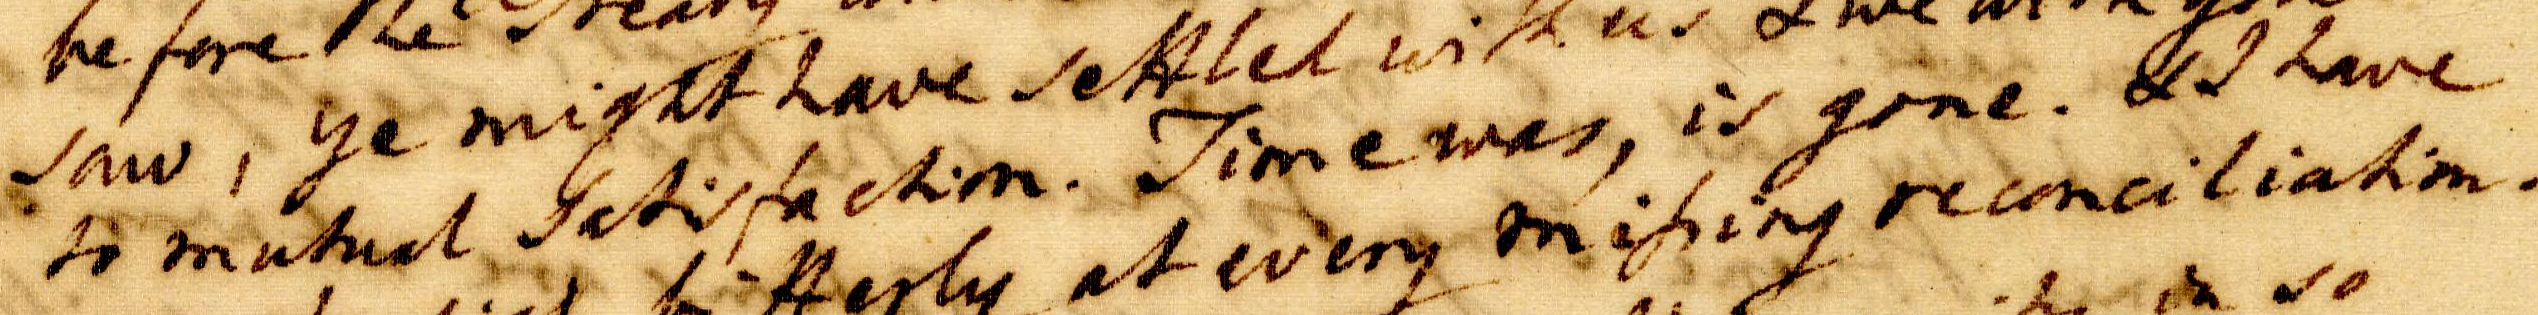to mutual satisfaction. Time was, is gone. & I have
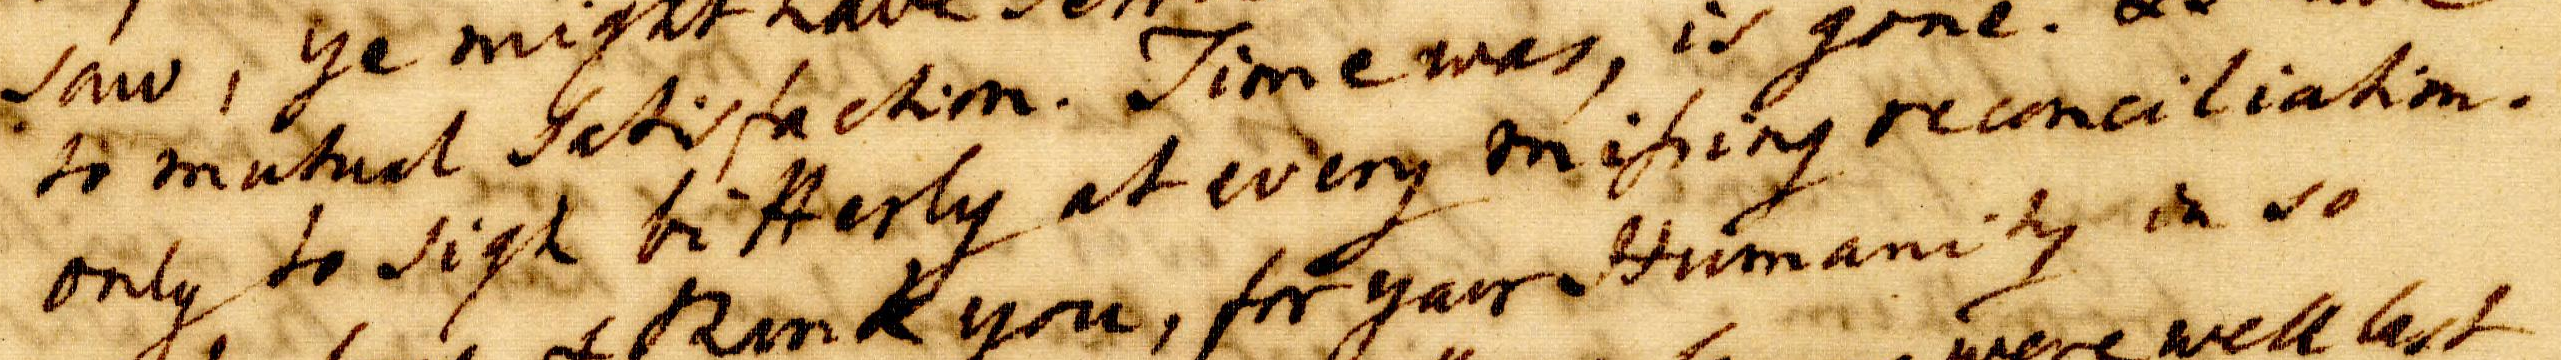only to sigh bitterly at every missing reconciliation.
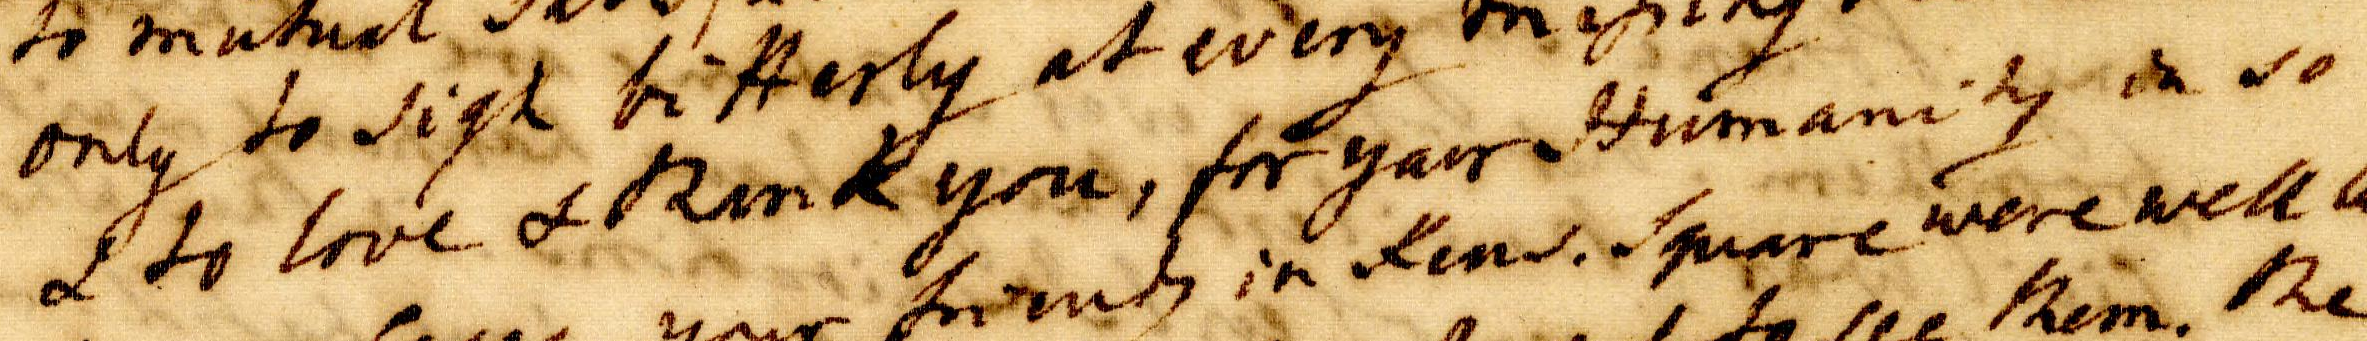& to love & thank you, for your Humanity in so
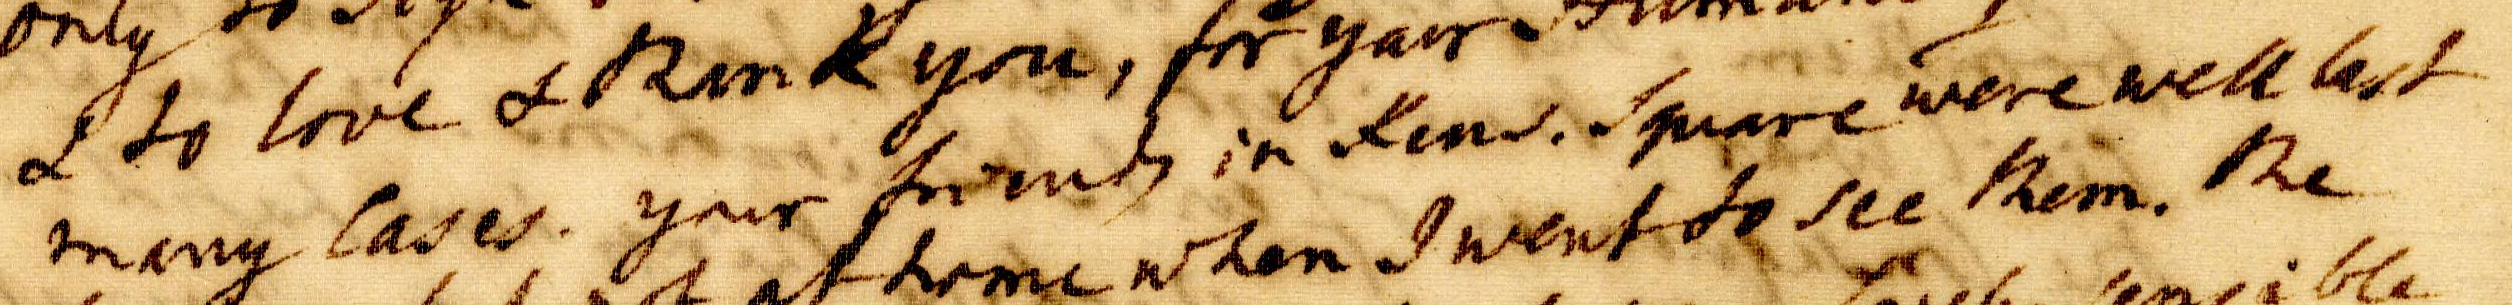many Cases. your friends in Kens. Square were well lest
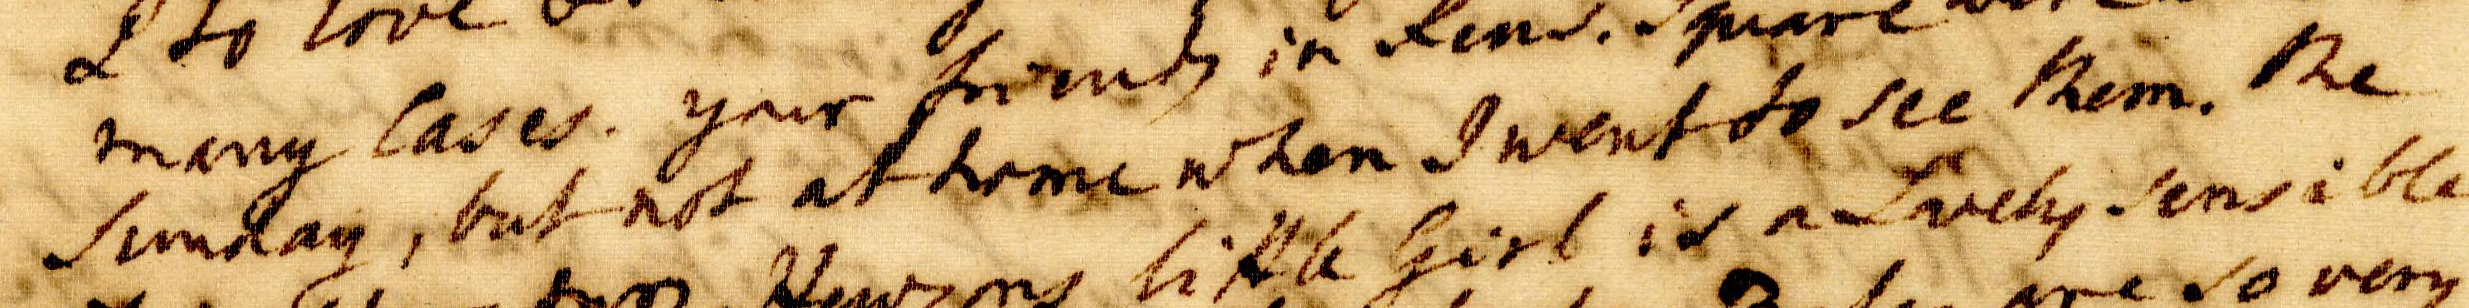Sunday, but not at home when I went to see them. the
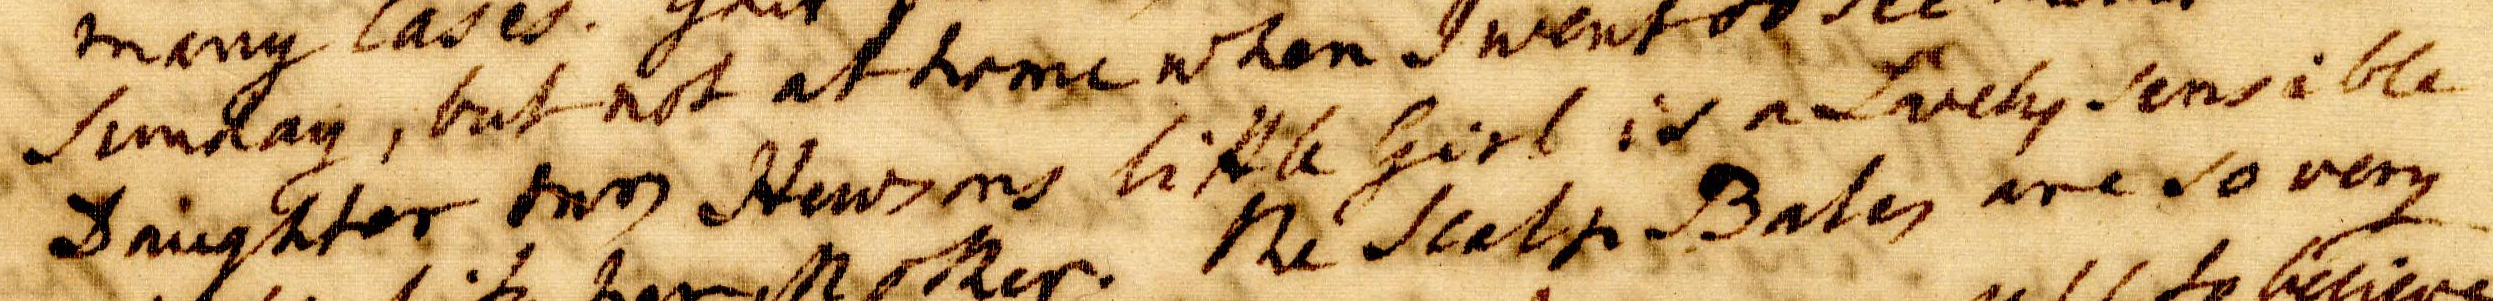Daughter M^r Hewsons little Girl is a Lovely sensible
